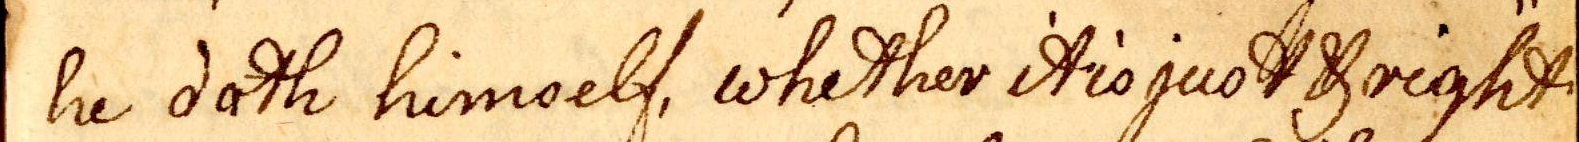he doth himself, whether it is just & right"
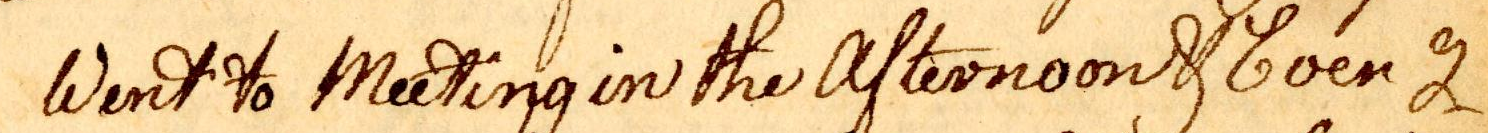Went to Meeting in the Afternoon & Even^g
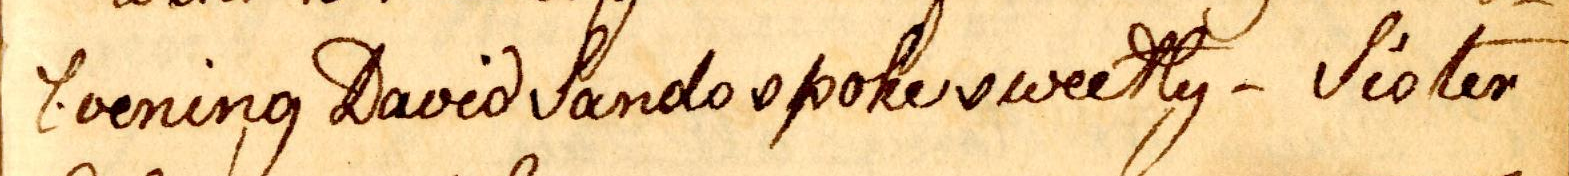Evening David Sands spoke sweetly- Sister
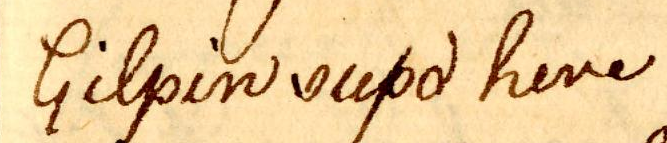Gilpins supd here
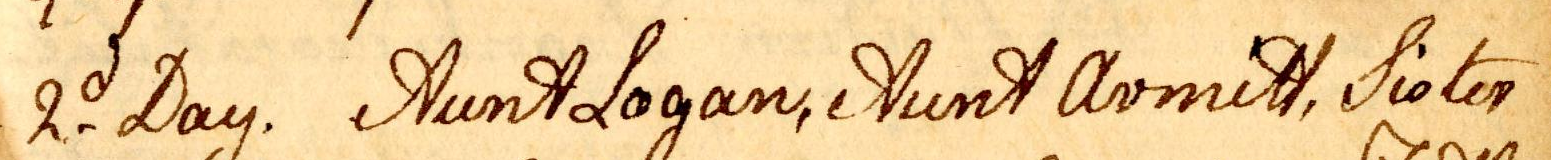2^d Day. Aunt Logan, Aunt Armitt, Sister
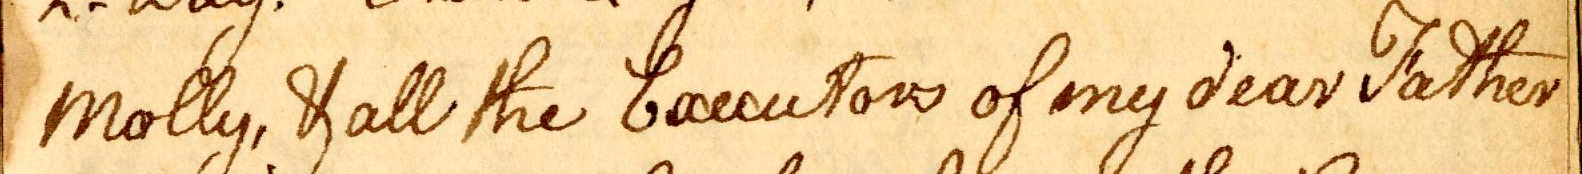Molly, & all the Executors of my dear Father
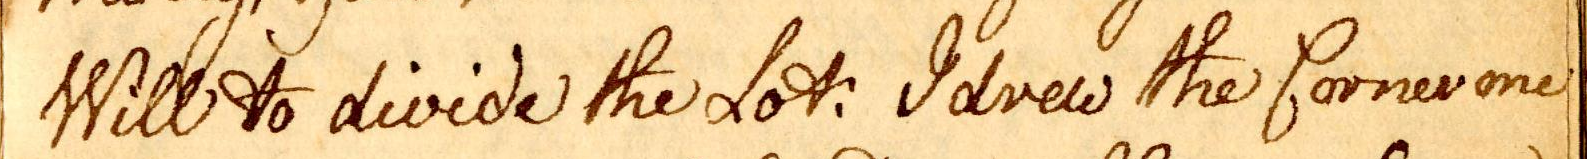Will to divide the Lot. I drew the Corner one
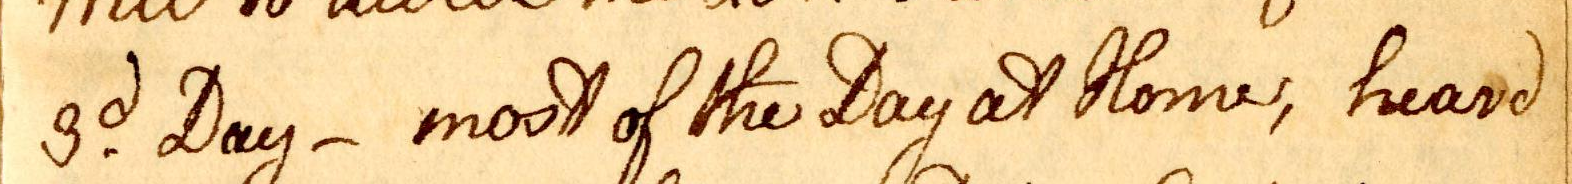3^d Day- most of the Day at Home, heard
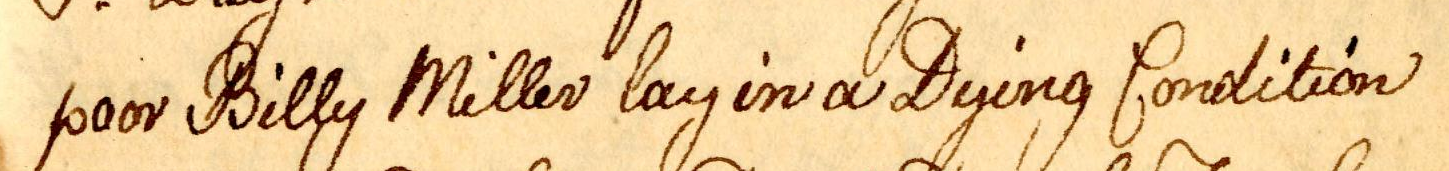poor Billy Miller lay in a Dying Condition
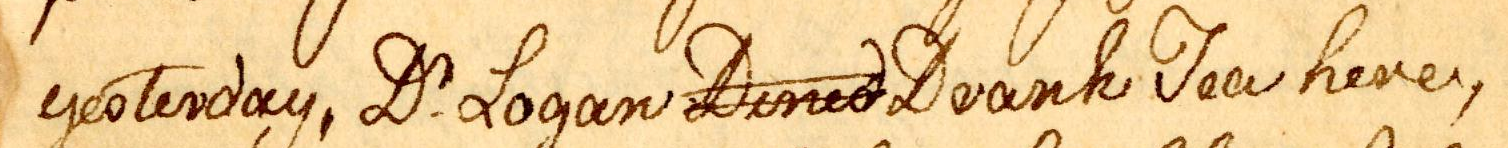yesterday, D^r. Logan [Dined] Drank Tea here,
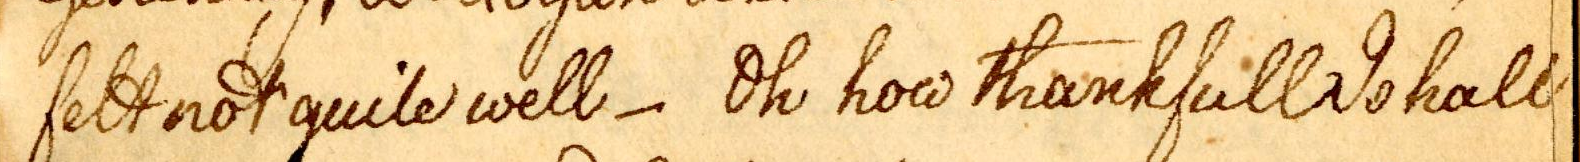felt not quite well- Oh how thankfull I shall
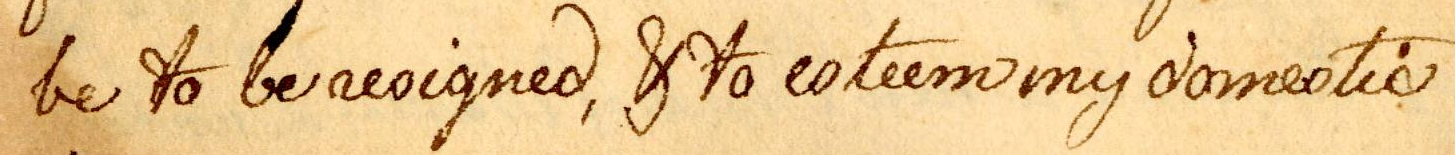be to resigned, & to esteem my domestic
